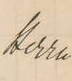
Ihnen
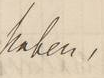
schon
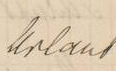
haben,
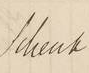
Schenk
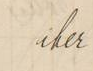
bei
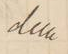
meinen
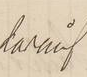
aber nicht
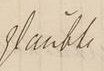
glaubte
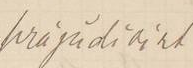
darauf eintreten
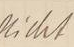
sollen,
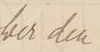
weil dem
